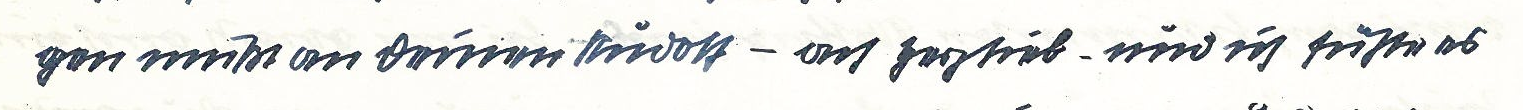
gen mußt an Deinen Rudolf – ach Herzlieb – und ich fühle es
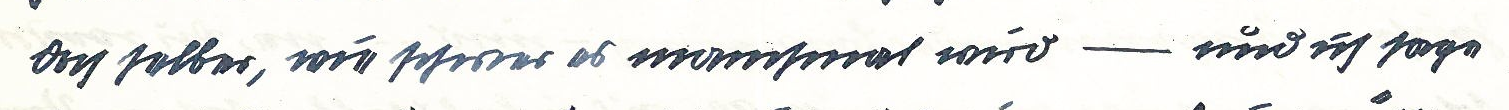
doch selber, wie schwer es manchmal wird — und ich sage
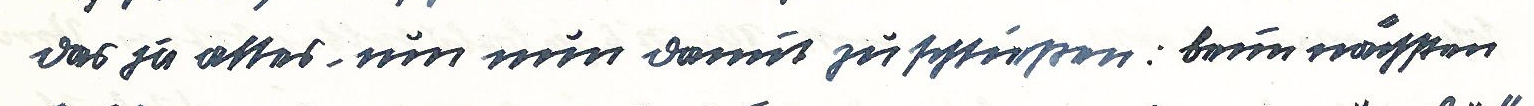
das ja alles, um nun damit zu schließen: beim nächsten
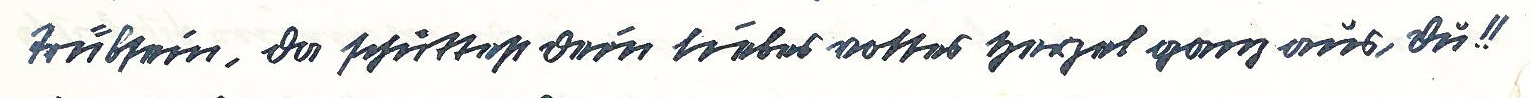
Trübsein, da schüttest Dein liebes volles Herzel ganz aus, Du!!
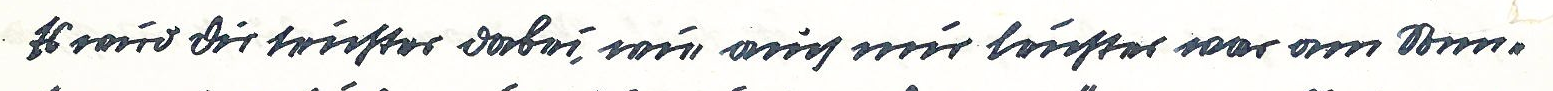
Es wird Dir leichter dabei, wie auch mir leichter war am Sonn¬
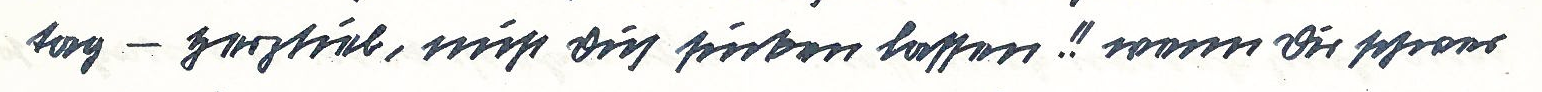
tag – Herzlieb, nicht Dich sinken lassen!! wenn Dir schwer
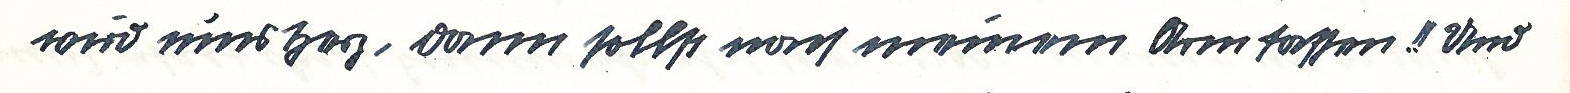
wird ums Herz, dann sollst nach meinem Arm fassen!! Und
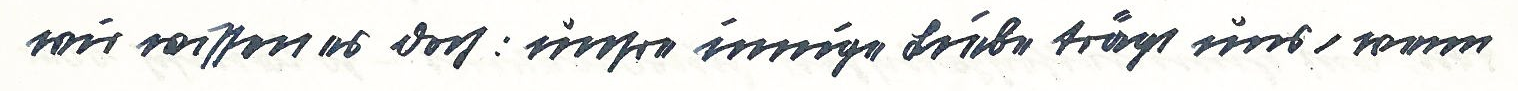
wir wissen es doch: unsre innige Liebe trägt uns, wenn
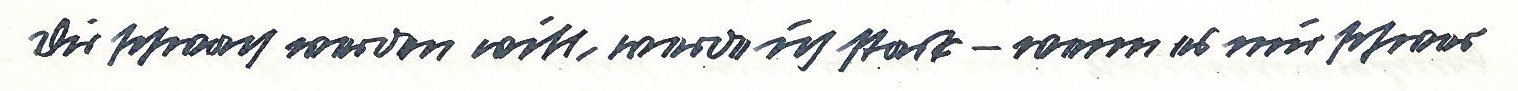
Dir schwach werden will, werde ich stark – wenn es mir schwer
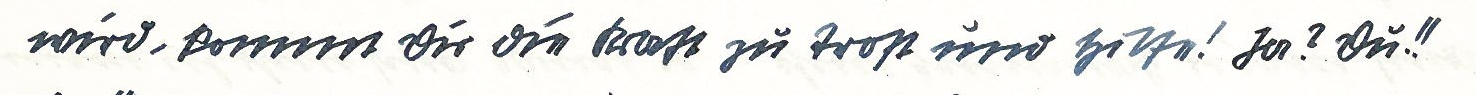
wird, kommt Dir die Kraft zu Trost und Hilfe! Ja? Du!! Du!!!
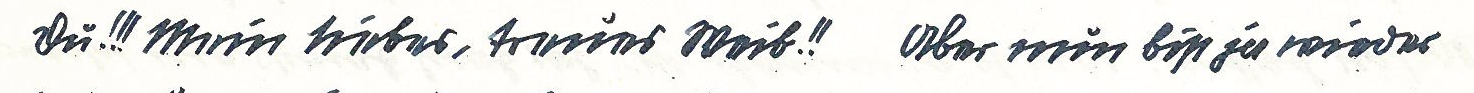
Mein liebes, treues Weib!! Aber nun bist Du ja wieder
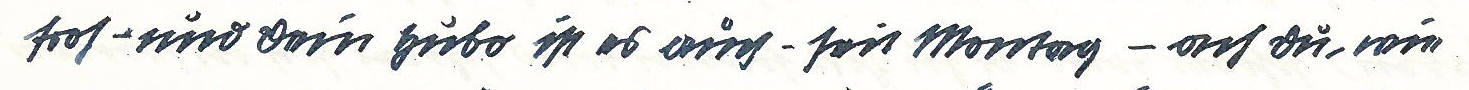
froh – und Dein Hubo ist es auch – seit Montag – ach Du, wie
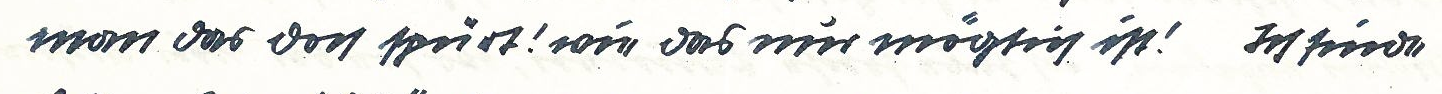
man das doch spürt! wie das nur möglich ist! Ich finde
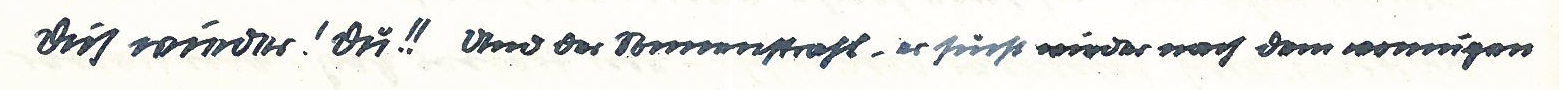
Dich wieder! Du!! Und der Sonnenstrahl, er sucht wieder nach dem sonnigen
